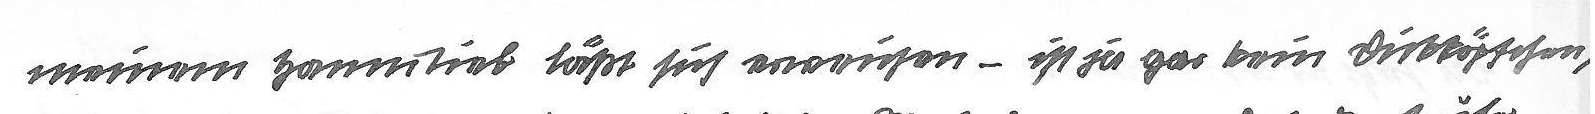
meinem lieb läßt sich erweichen – ist ja gar kein Dickköpfchen,
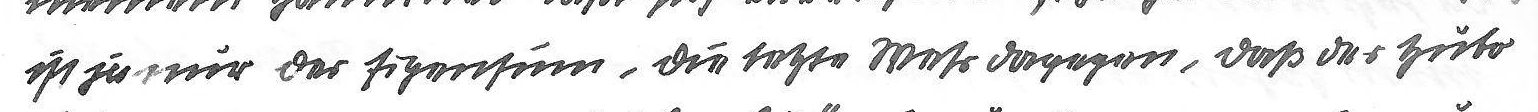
ist ja nur der Eigensinn – die letzte Wehr dagegen, daß der Hubo
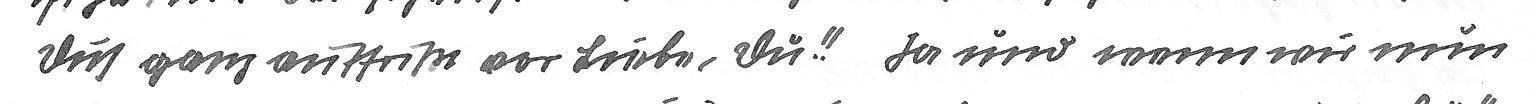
Dich ganz auffrisst vor Liebe, Du!! Ja und wenn wir nun
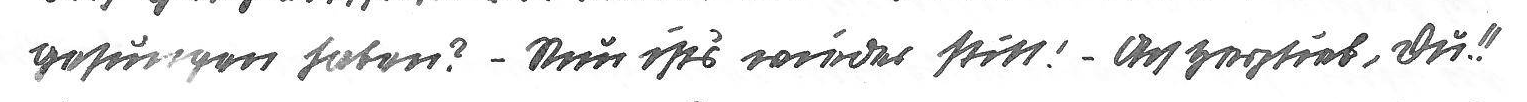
gesungen haben? – Nun ist’s wieder still! – Ach Herzlieb, Du!!
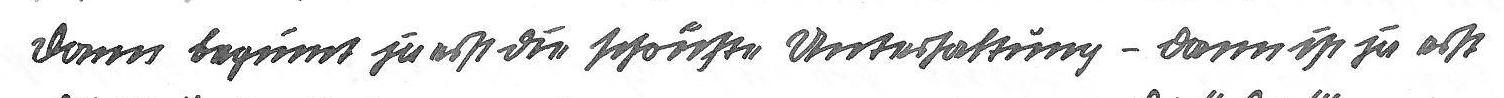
Dann beginnt ja erst die schönste Unterhaltung – dann ist ja erst
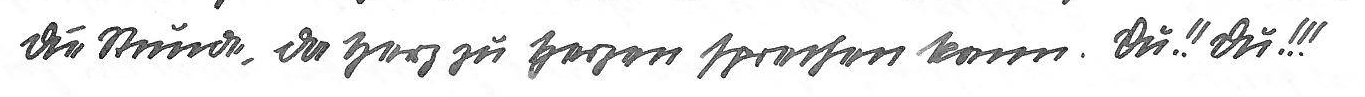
die Stunde, da Herz zu Herzen sprechen kann. Du!! Du!!!
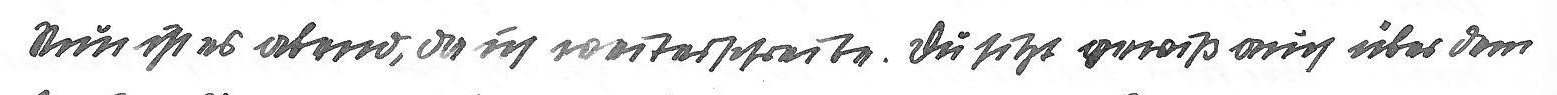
Nun ist es abend, da ich weiterschreibe. Du sitzt gewiß auch über dem
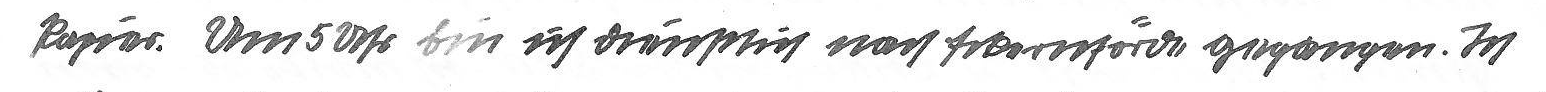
Papier. Um 5 Uhr bin ich dienstlich nach Eckernförde gegangen. Ich
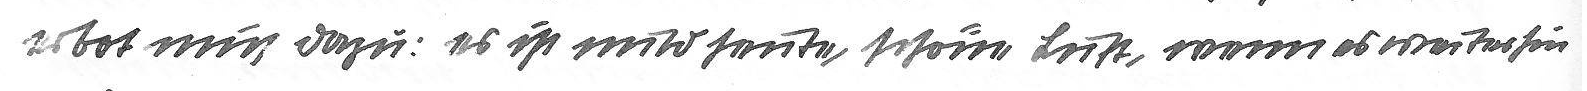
erbot mich dazu: es ist mild heute, schöne Luft, wenn es weiterhin
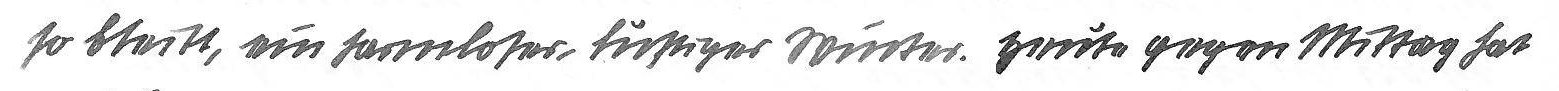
so bleibt, ein harmloser, luftiger Winter. Heute gegen Mittag hat
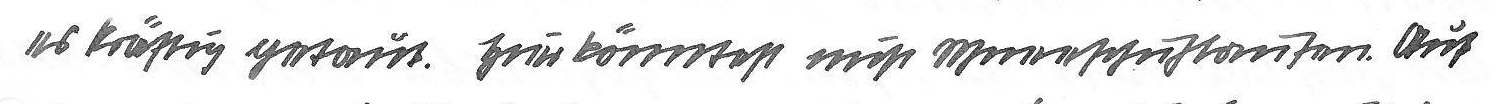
es kräftig getaut. Hier könntest nicht Schneeschuhlaufen. Auf
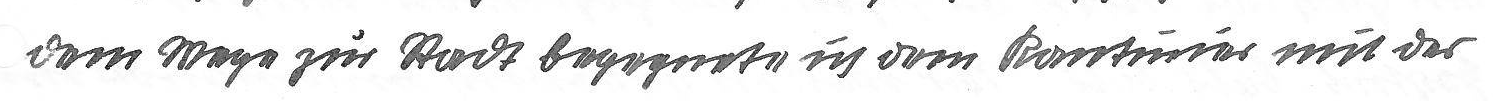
dem Wege zur Stadt begegnete ich dem Kantinier mit der
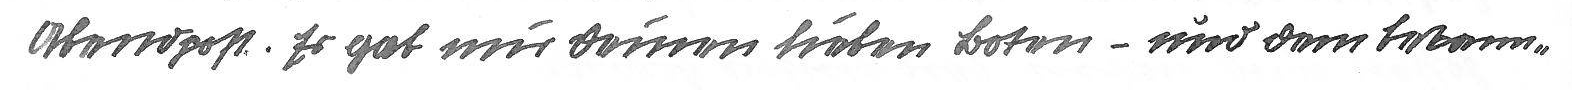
Abendpost. Er gab mir Deinen lieben Boten – und dem bekann¬
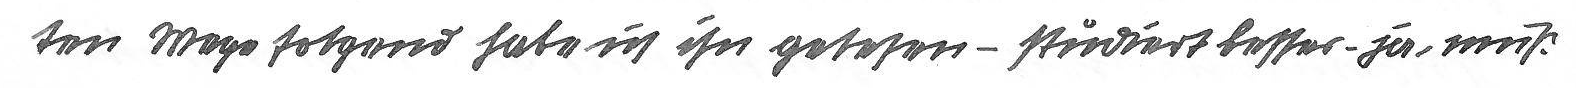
ten Wege folgend habe ich ihn gelesen – studiert besser – ja, muß
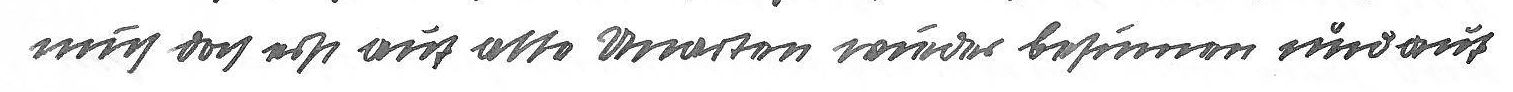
mich doch erst auf alle Unarten wieder besinnen und auf
